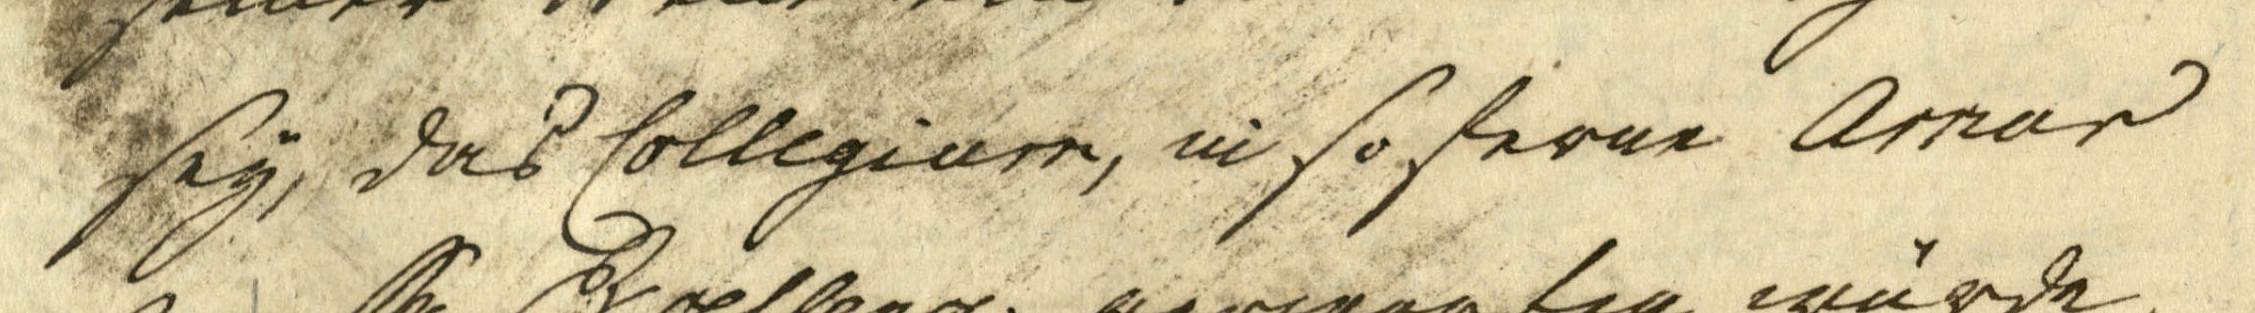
seÿ, das Collegium, in so ferne Amor
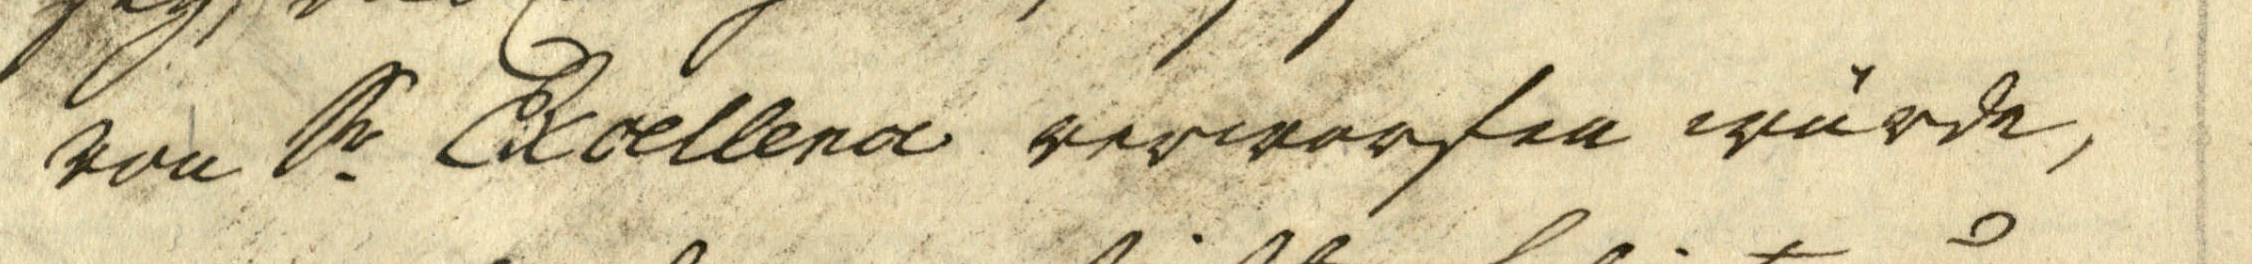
von Sr. Excellence verworfen würde,
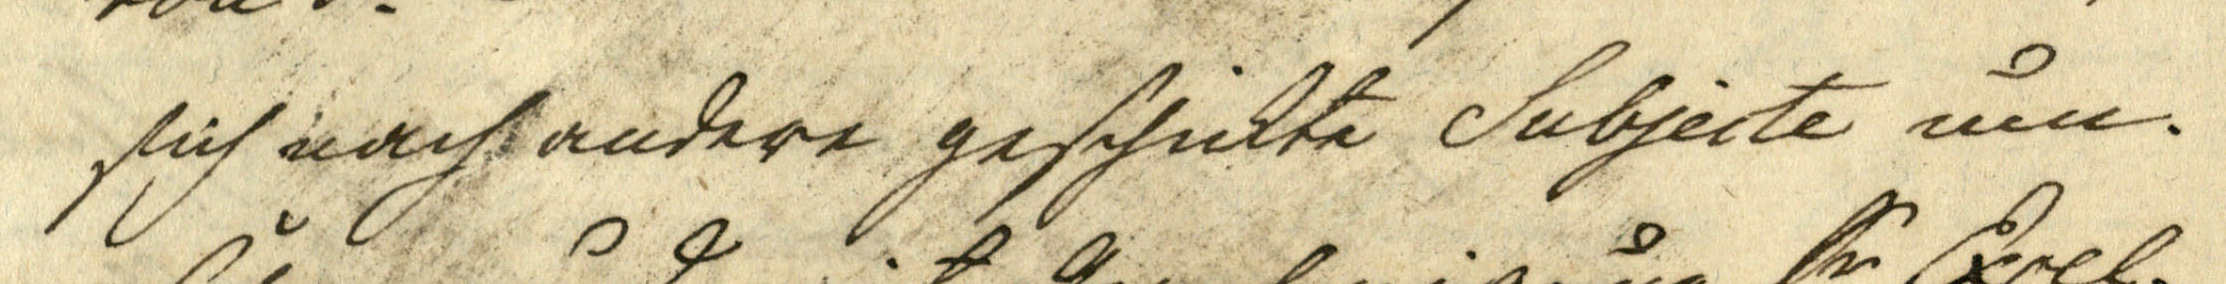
sich nach andere geschickte Subjecte um¬
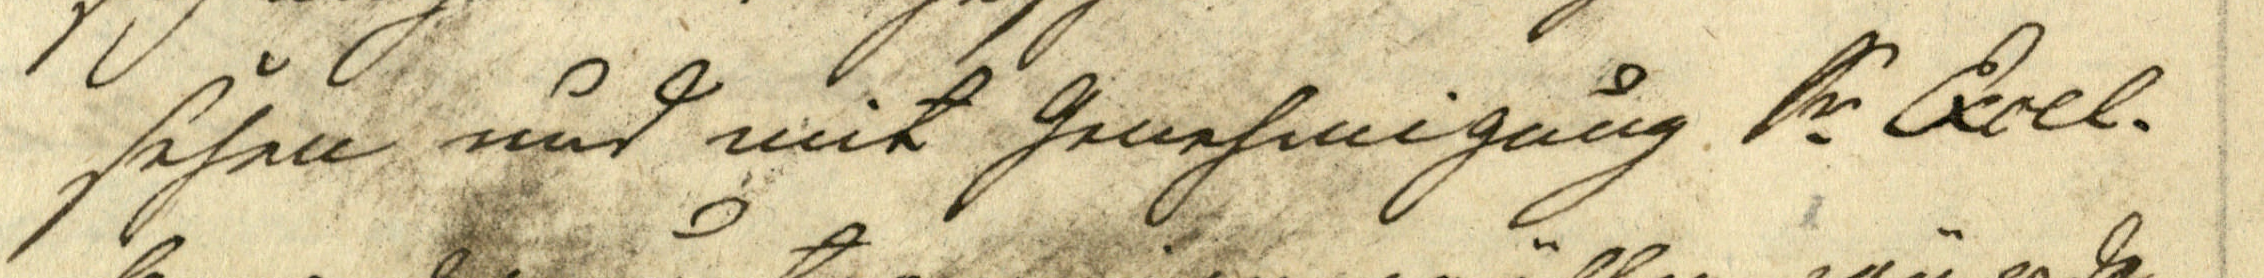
sehen und mit Genehmigung Sr Excel¬
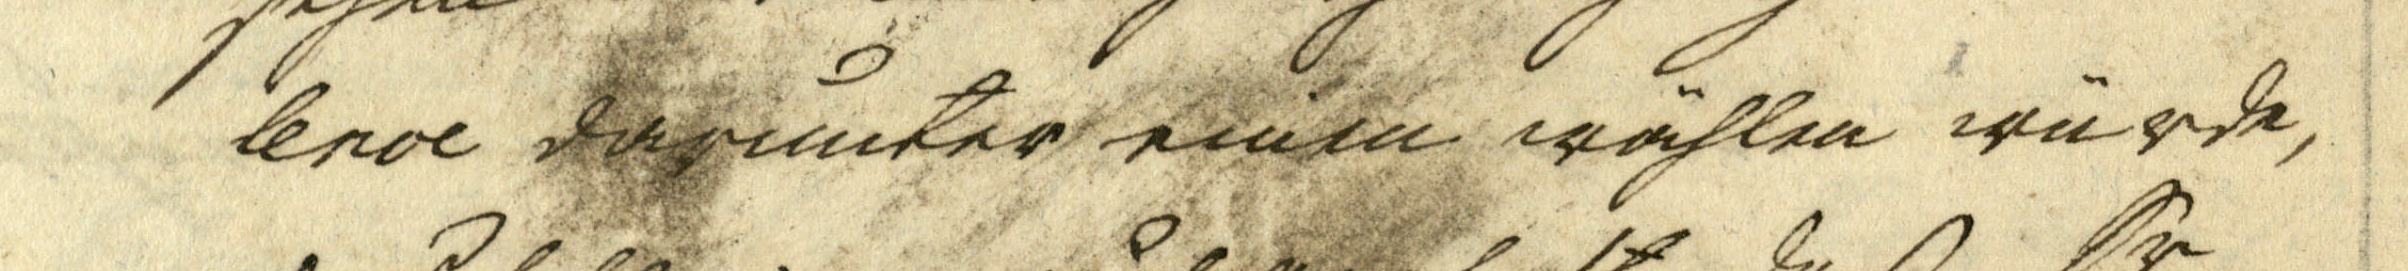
lence darunter einen wählen würde,
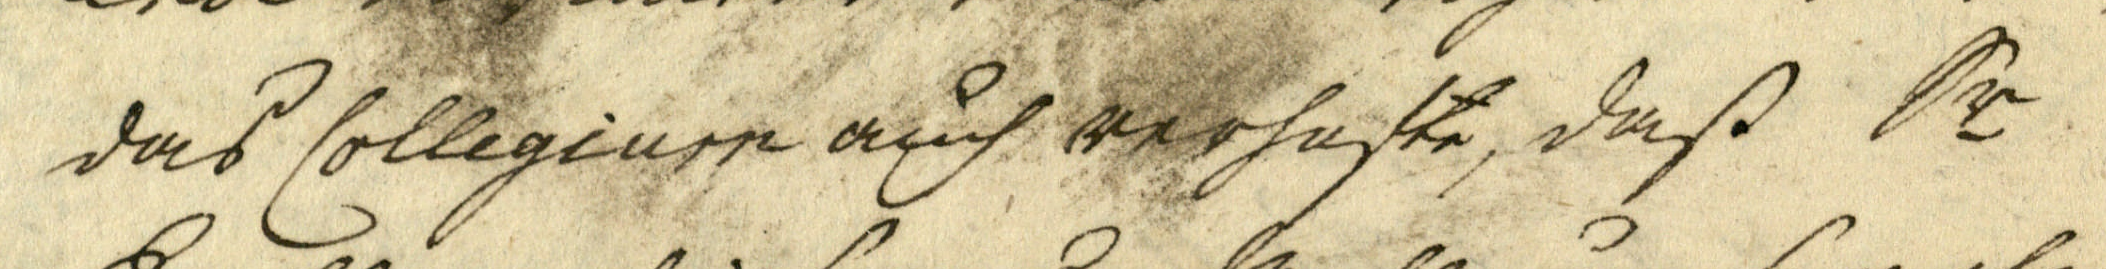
das Collegium auch verhafte, daß Sr
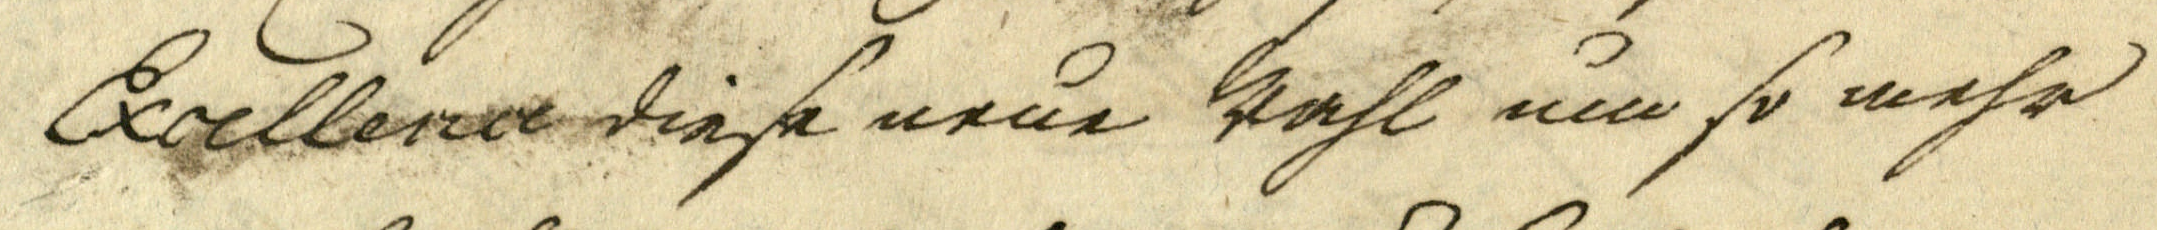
Excellence diese neue Wahl um so mehr
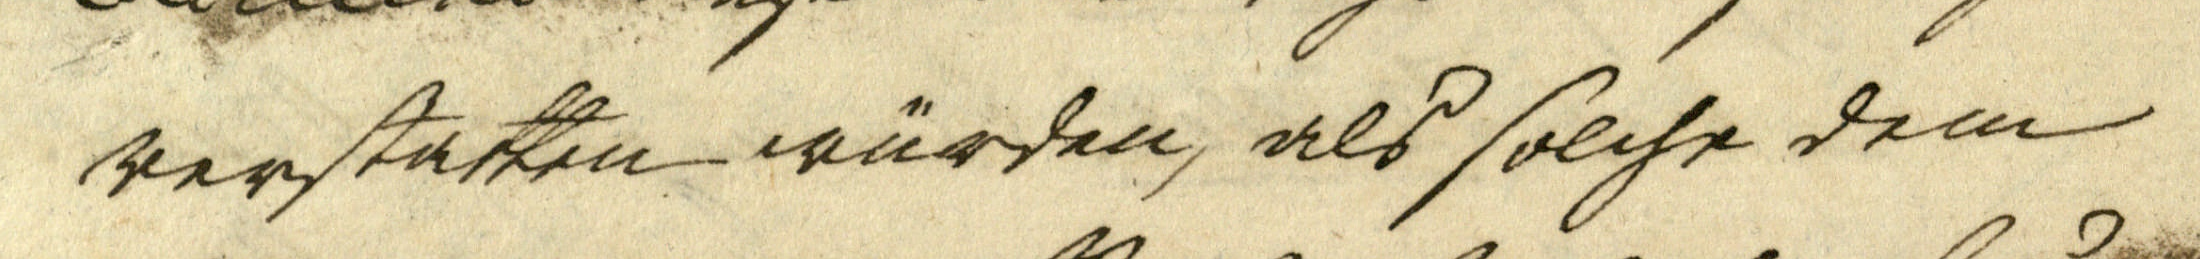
verstatten würden, als solche dem
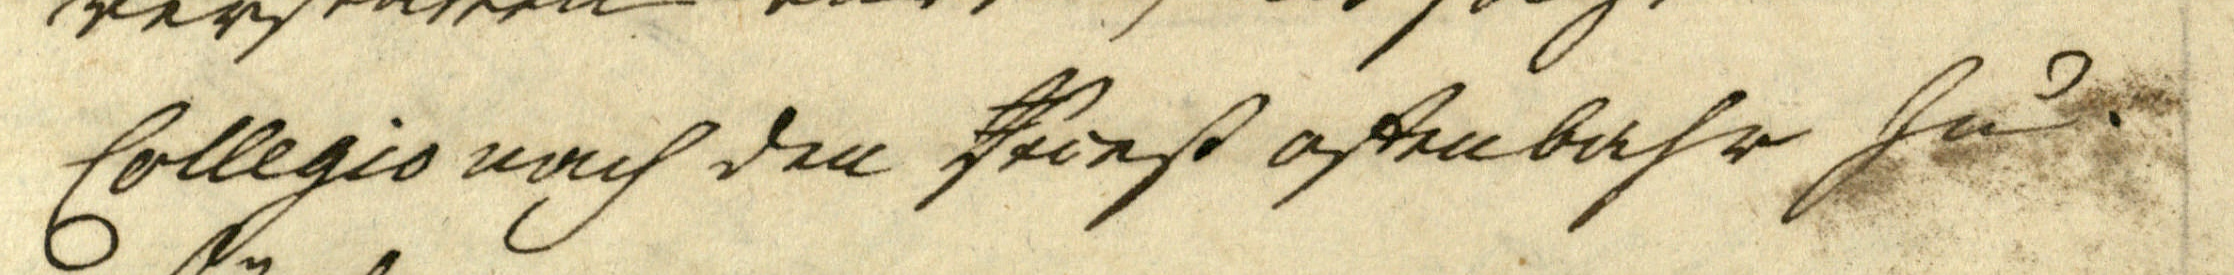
Collegio nach den Receß offenbahr zu¬
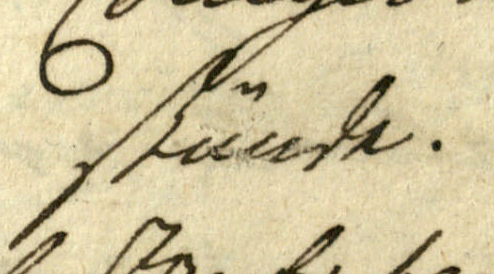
stünde.
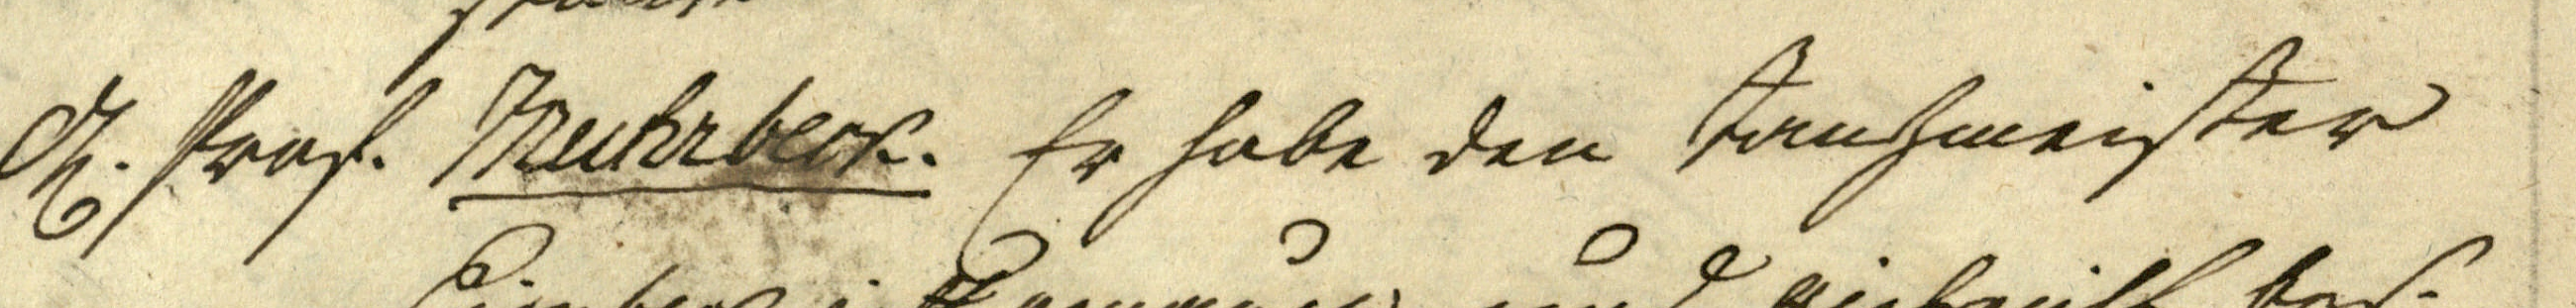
dh. Prof. Muhrbeck. Er habe den Tanzmeister
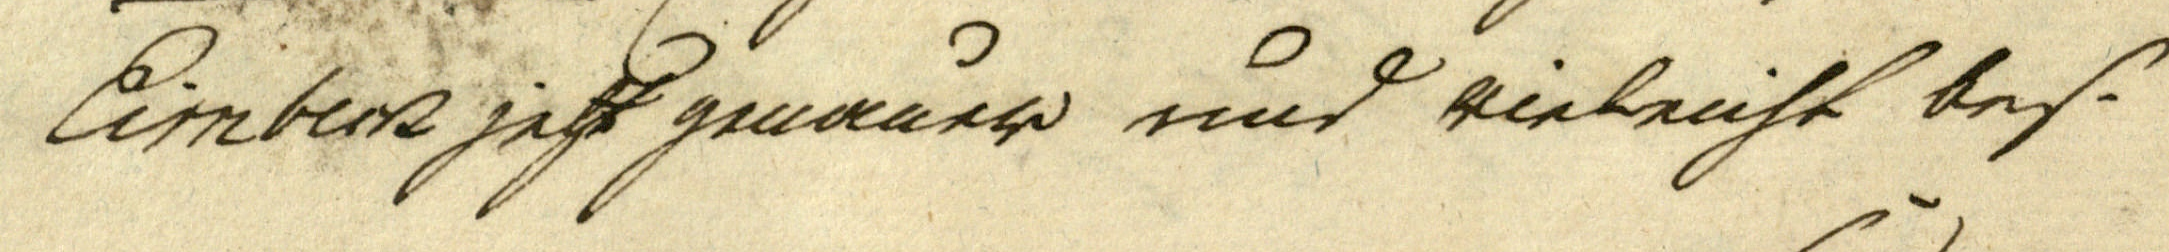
Eimbeck jetzt genauer und vieleicht bes¬
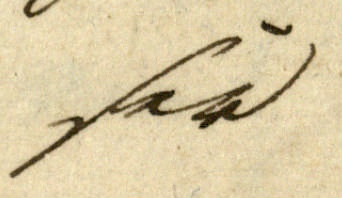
ser
